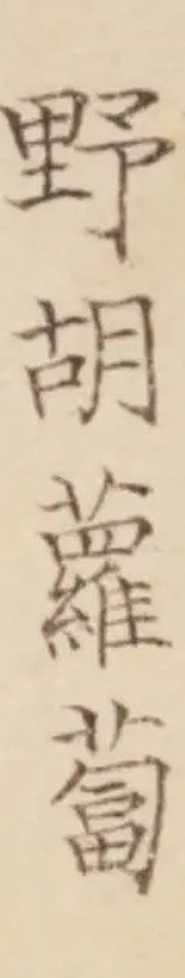野胡蘿蔔
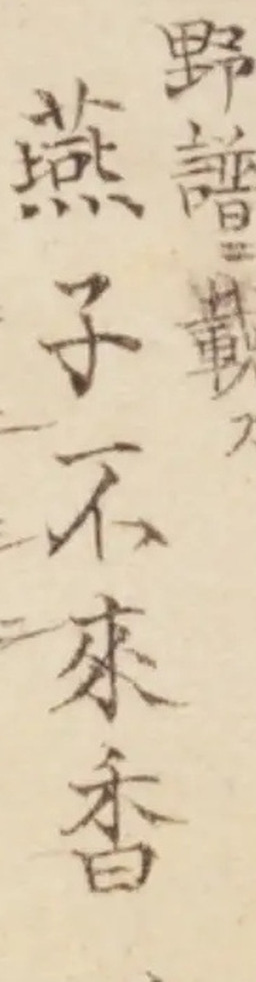燕子不來香
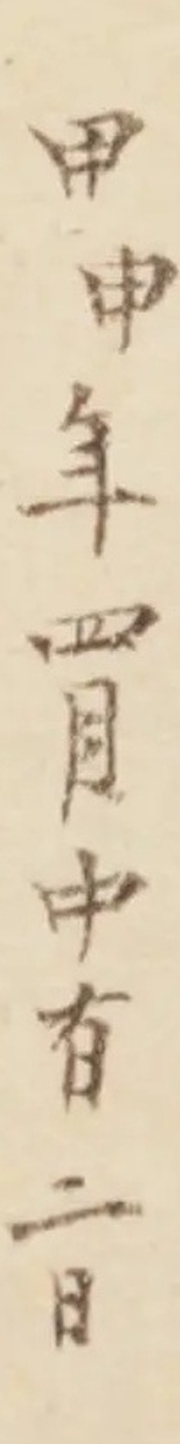甲申年四月中有二日
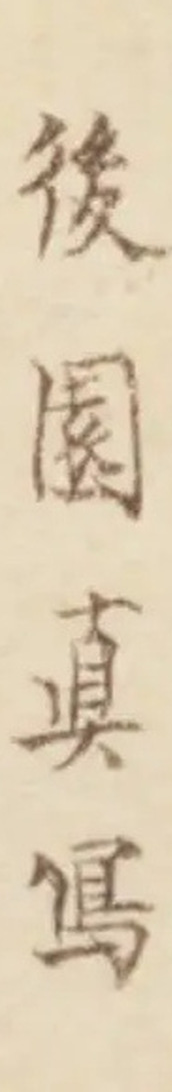後園真寫
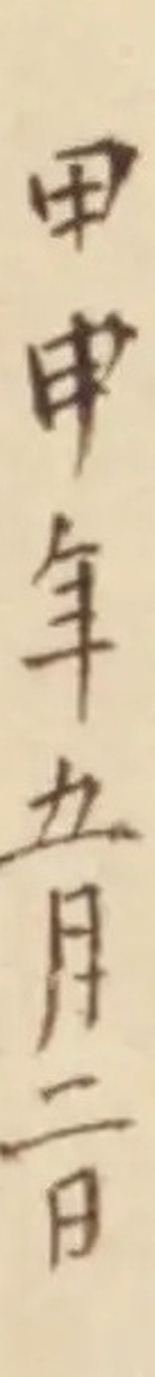甲申年五月二日
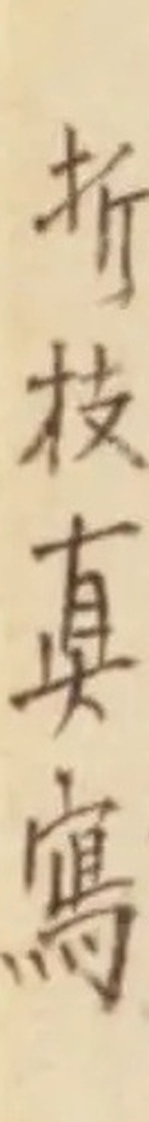折枝真寫
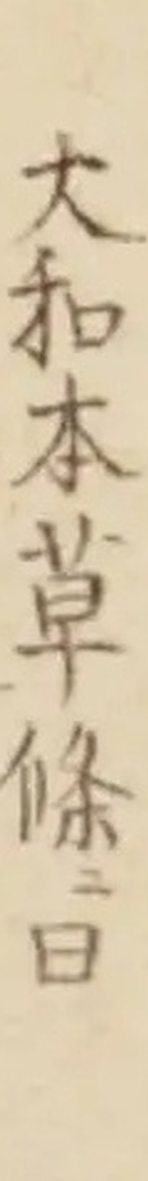大和本草ニ曰
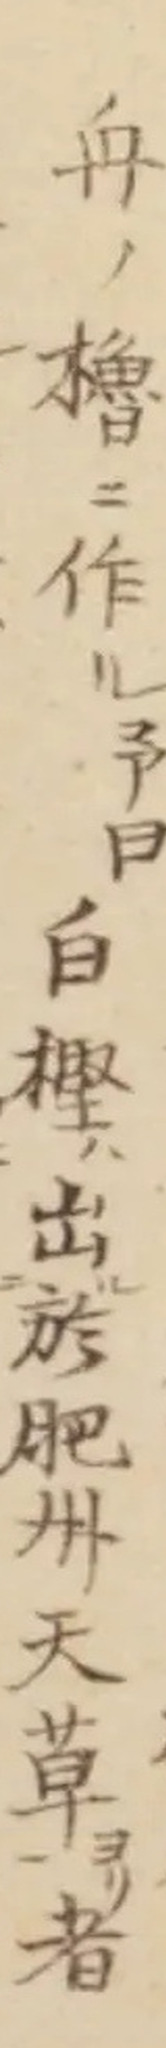舟の櫓に作る予曰白樫は出る於肥州天草より者

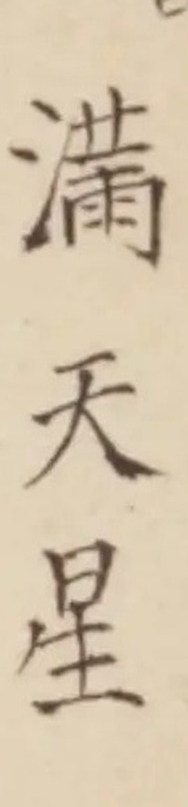満天星
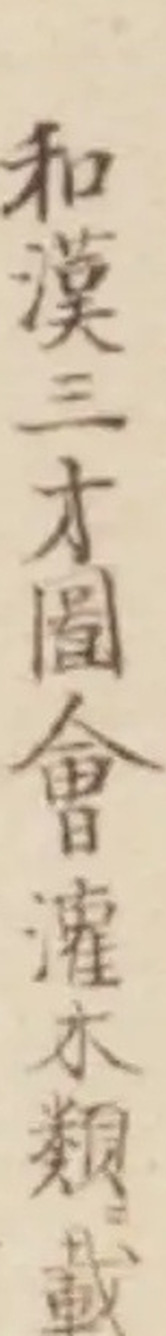和漢三才圖會灌木類ニ曰
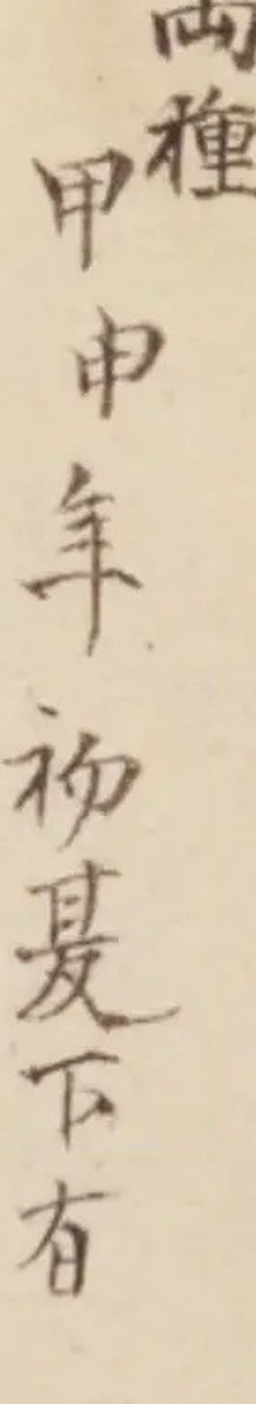両種甲申年初夏下有
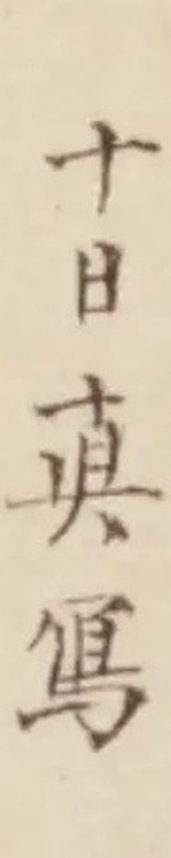十日真寫
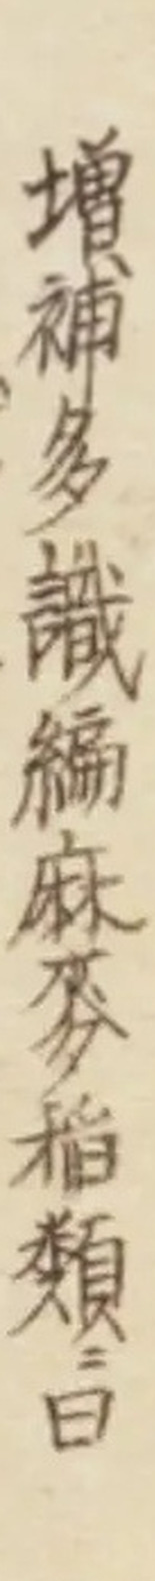増補多識編毒草類ニ曰

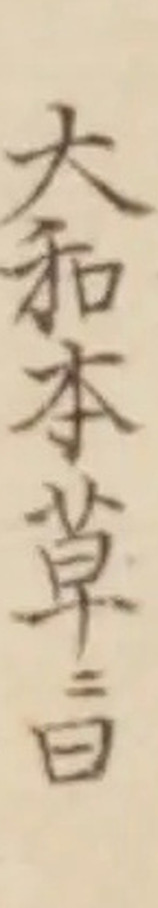大和本草曰
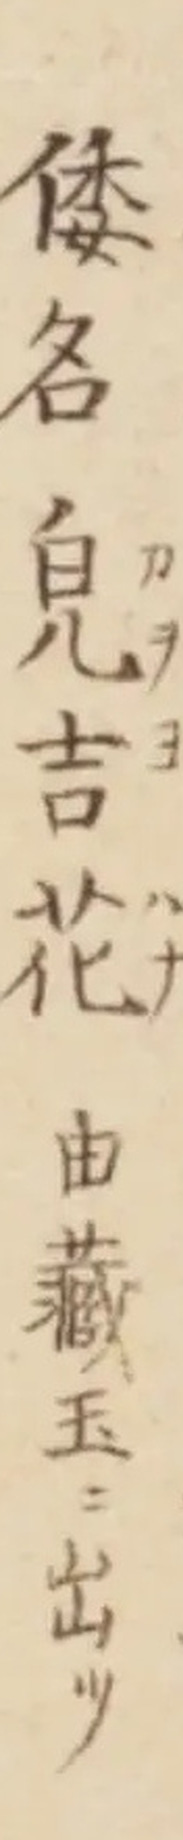倭名皃吉花由蔵玉に出つ
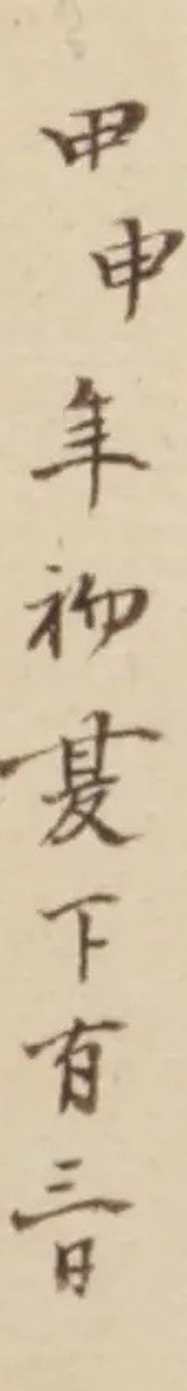甲申年初夏下有三日
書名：梅園草木花譜夏之部. 2
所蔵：国立国会図書館 National Diet Library, JAPAN
